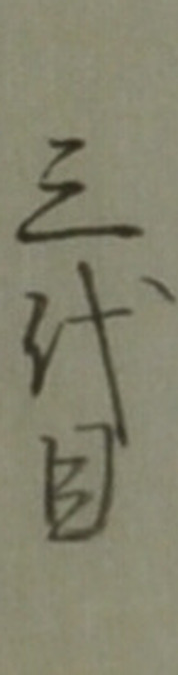三代目
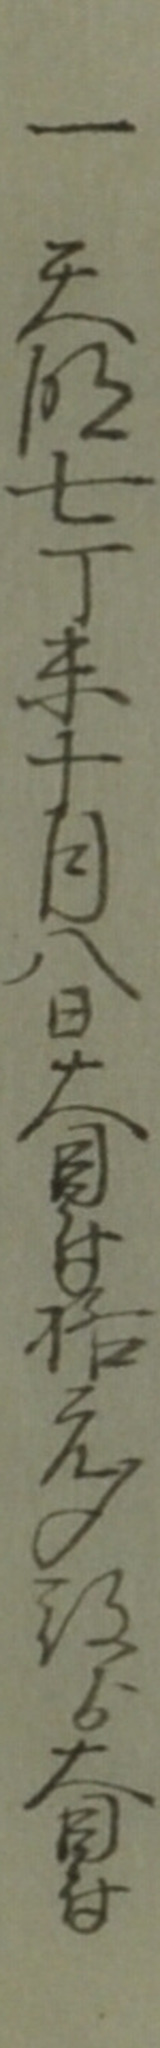一天明七丁未十月八日大目付格元〆役ゟ大目付
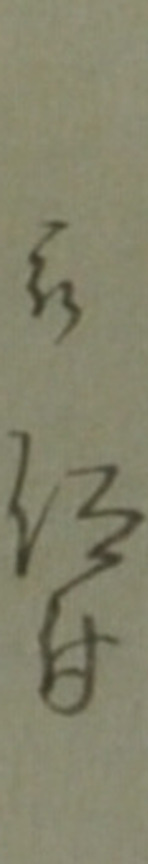被仰付
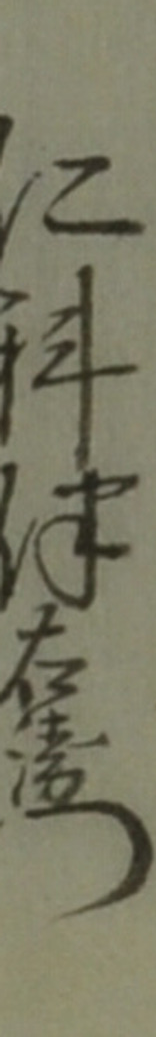仁科伴右衛門
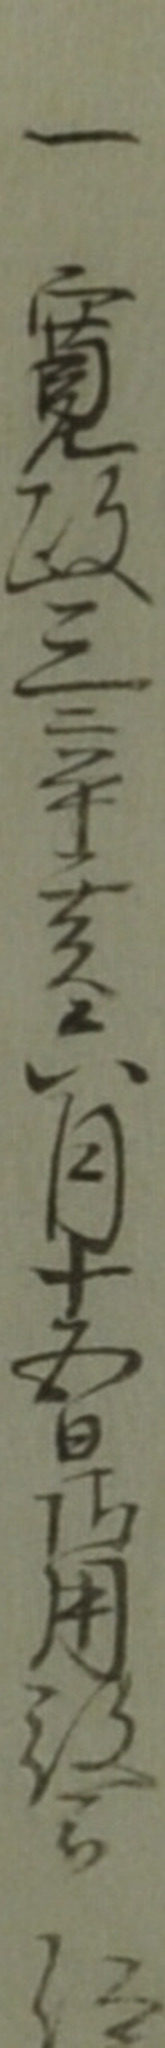一寛政三辛亥六月十五日御用役被仰付
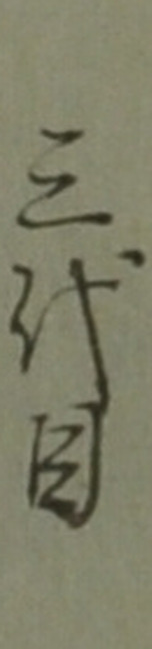三代目
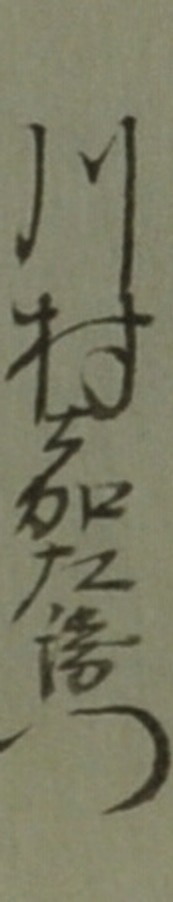川村嘉左衛門
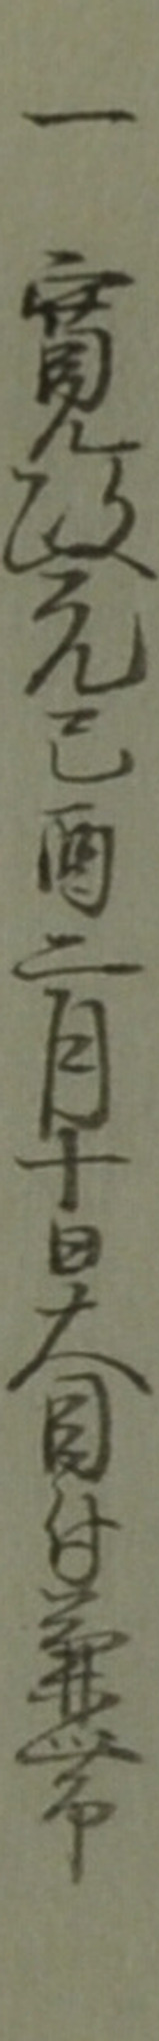一寛政元己酉二月十日大目付兼帯
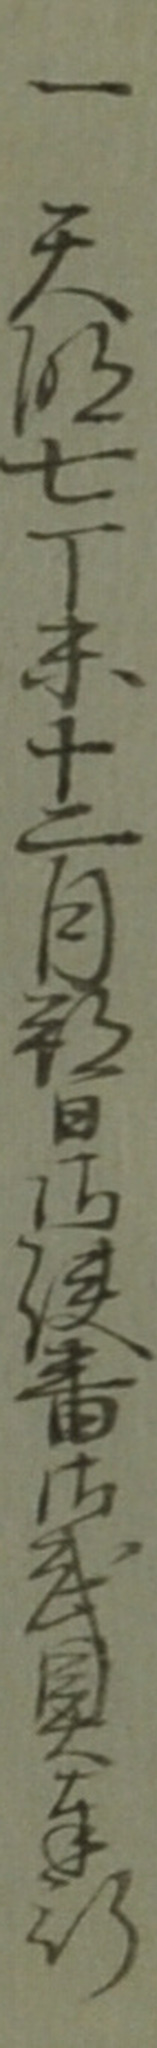一天明七丁未十二月朔日御使番御武具奉行
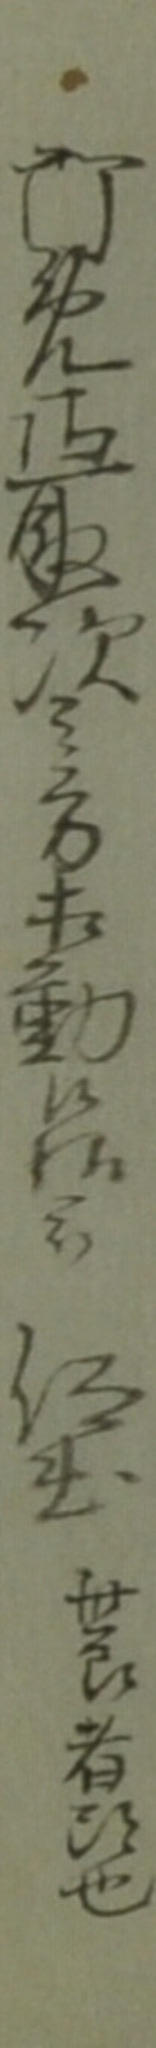御免御取次之方相勤候様被仰出此節者頭也
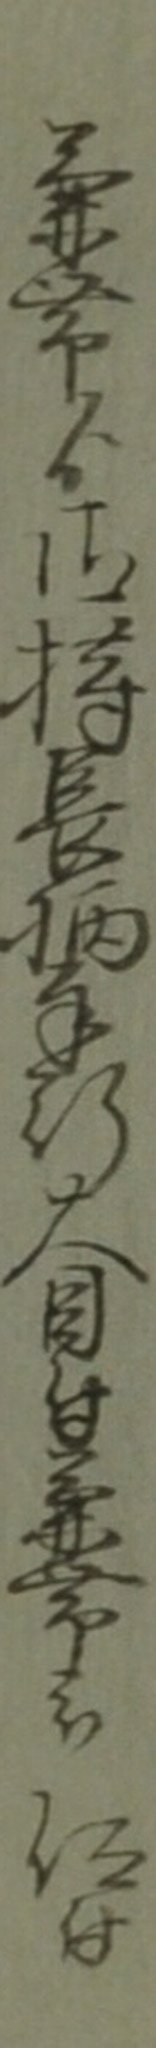兼帯ゟ御持長柄奉行大目付兼帯被仰付
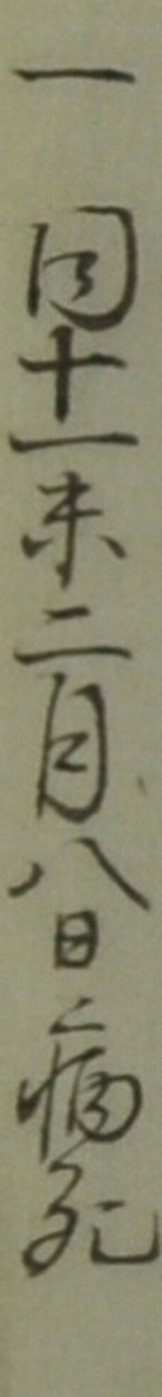一同十一未二月八日病死
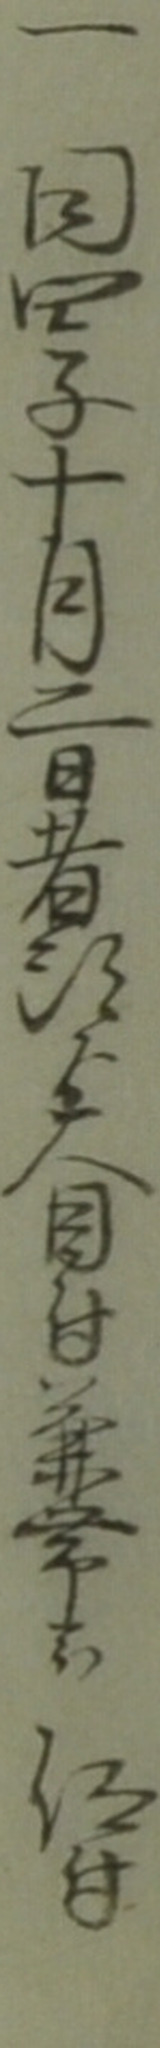一同四子十月二日者頭ゟ大目付兼帯被仰付

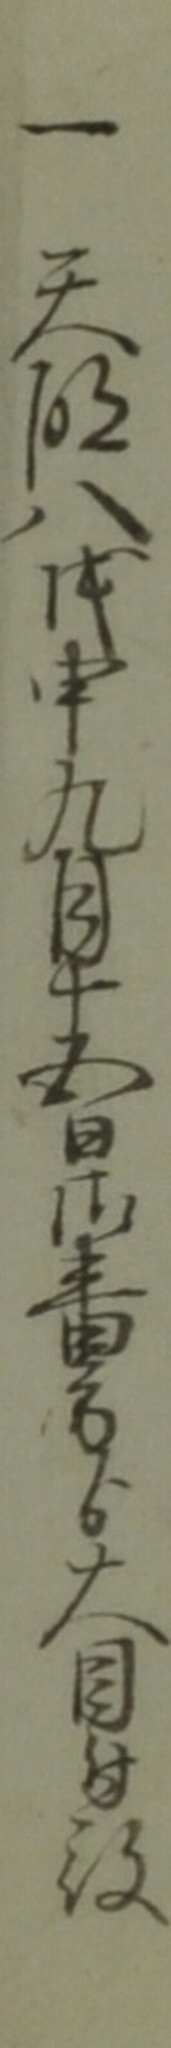一天明八戊申九月十五日御番ゟ大目付役
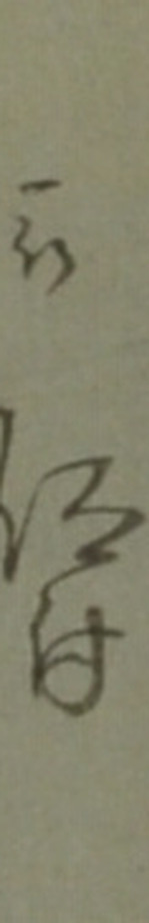被仰付
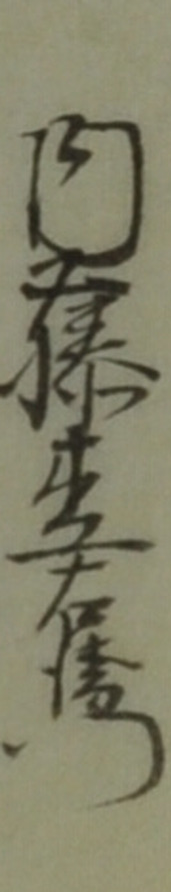内藤杢右衛門
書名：諸御役代々録（三）
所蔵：伊那市立高遠町図書館・合同会社AMANE
